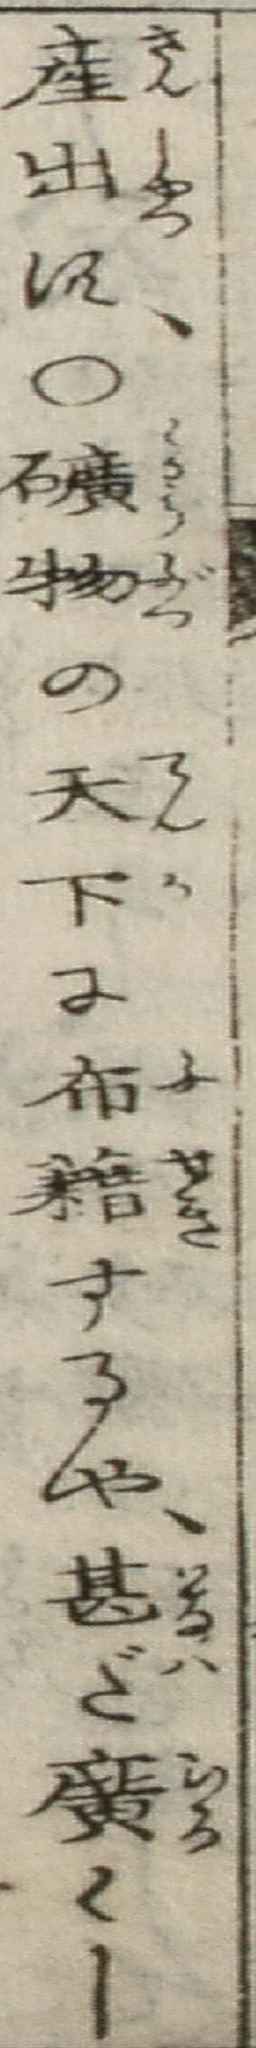産出す、○砿物の天下に布籍するや、甚だ広くし
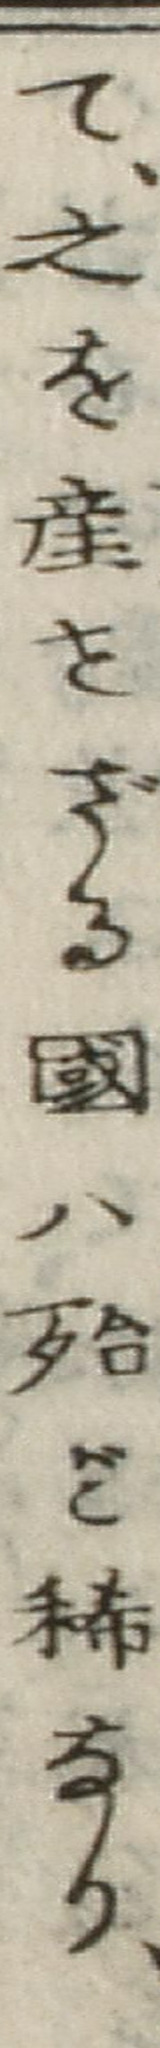て、之を産せざる国は殆ど稀なり、
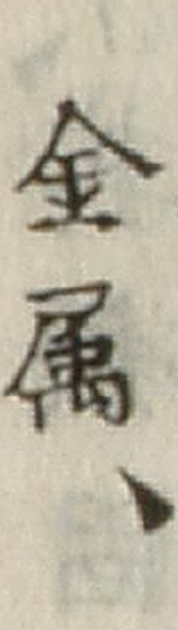金属、
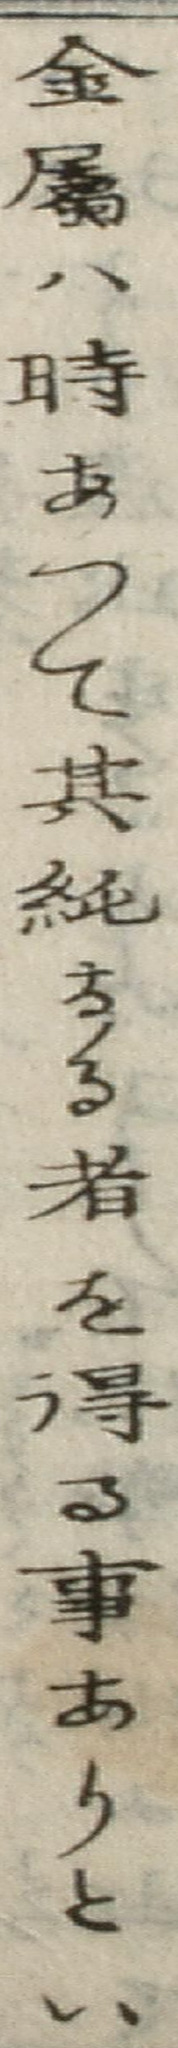金属は時あつて其純なる者を得る事ありとい
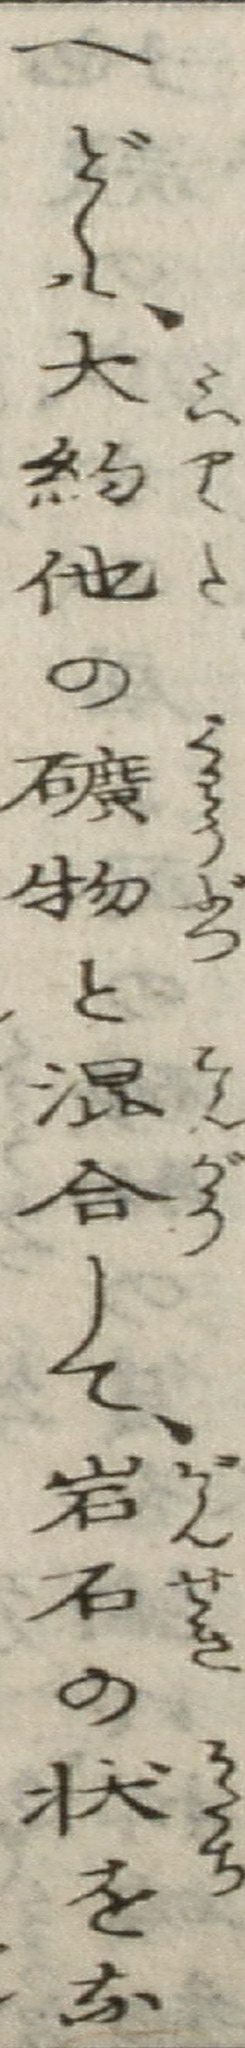へども、大約他の砿物と混合して、岩石の状をな
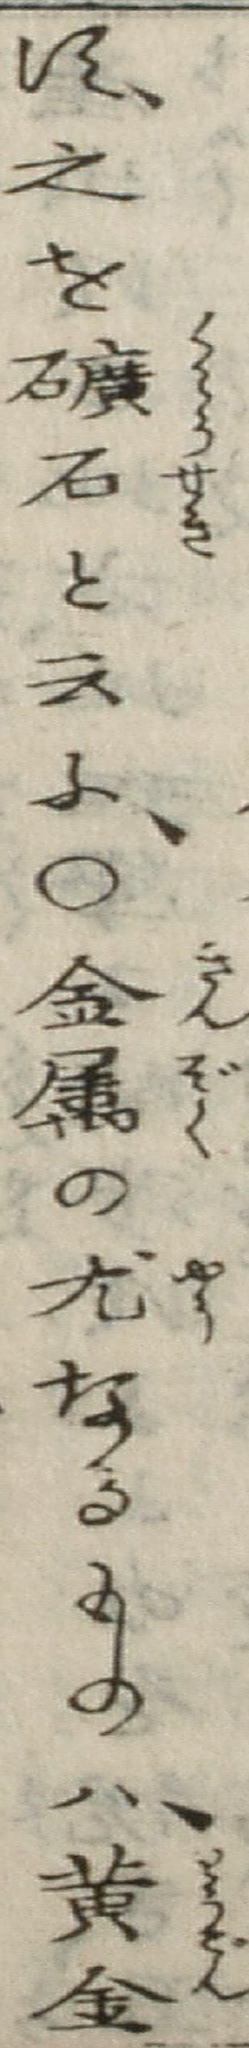す、之を砿石と云ふ、○金属の尤なるものは、黄金
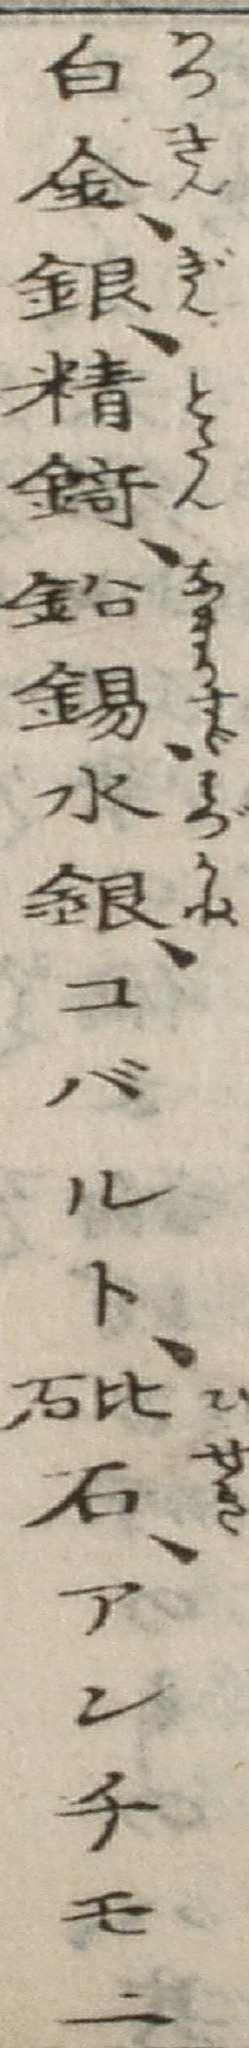白金、銀、精錡、鉛錫、水銀、コバルト、砒石、アンチモ二
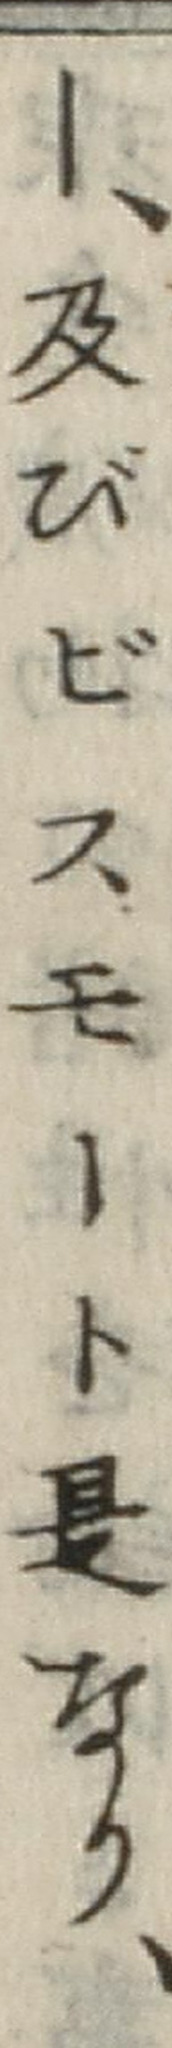ー、及びビスモート是なり、
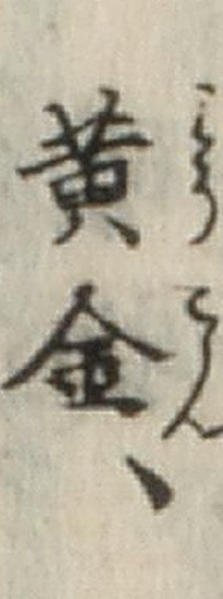黄金、
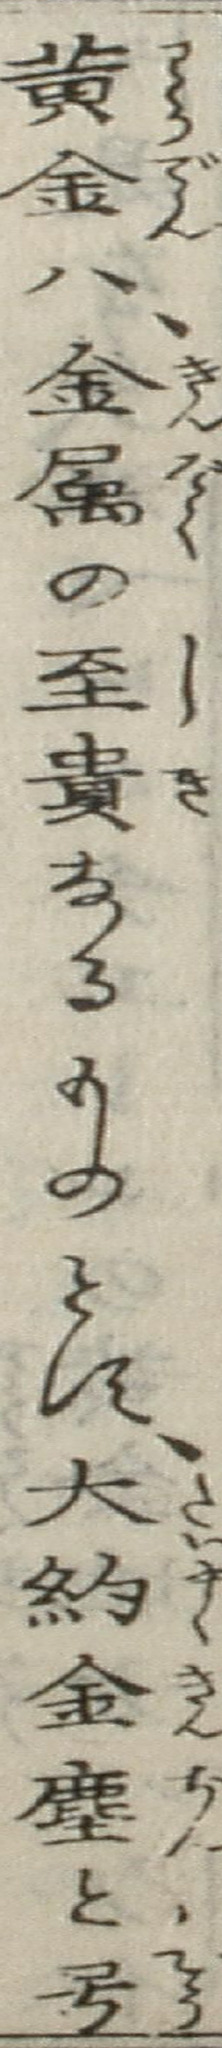黄金は、金属の至貴なるものとす、大約金塵と号
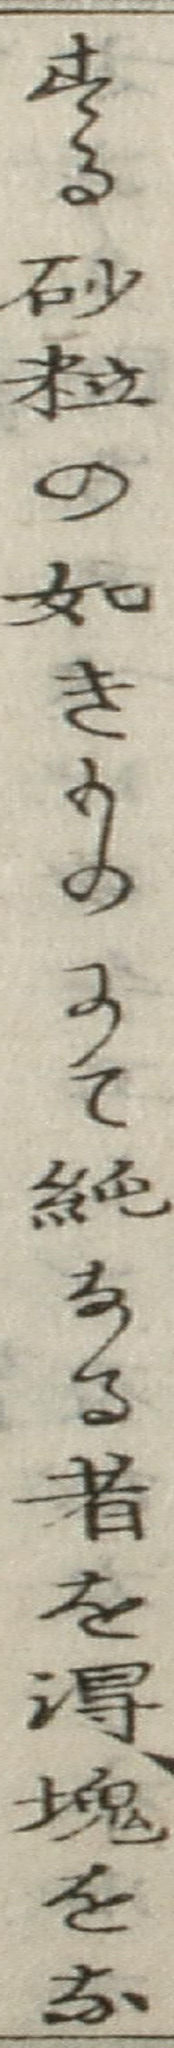する砂粒の如きものにて純なる者を得、塊をな
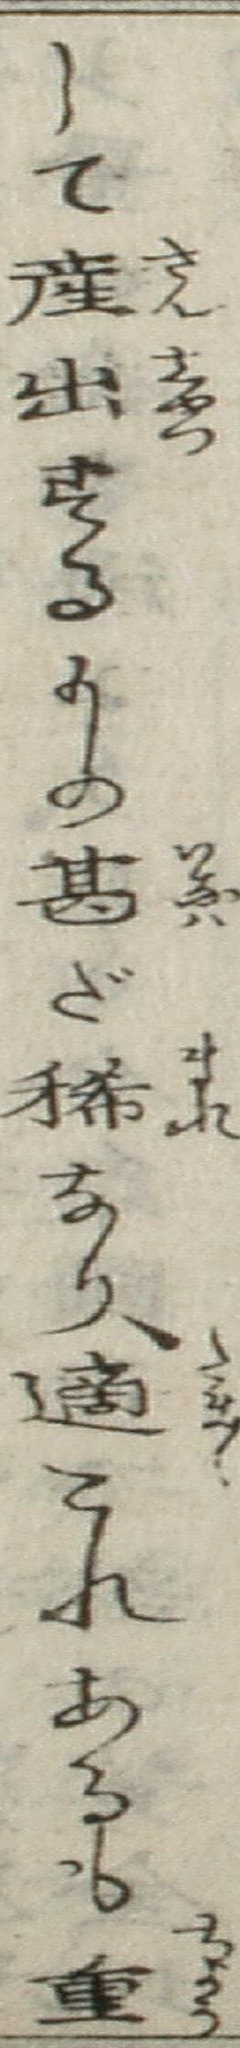して産出するもの甚だ稀なり、適これあるも重
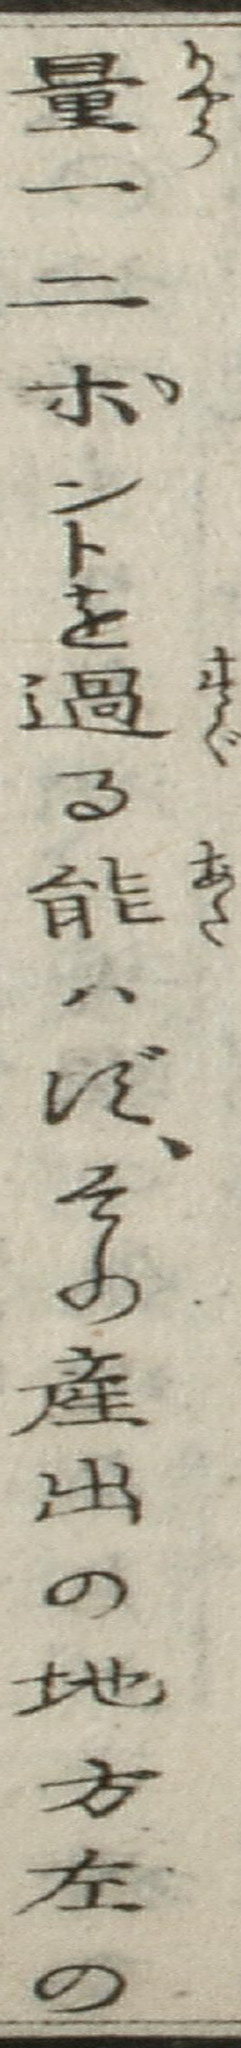量一二ポントを過る能はず、その産出の地方左の
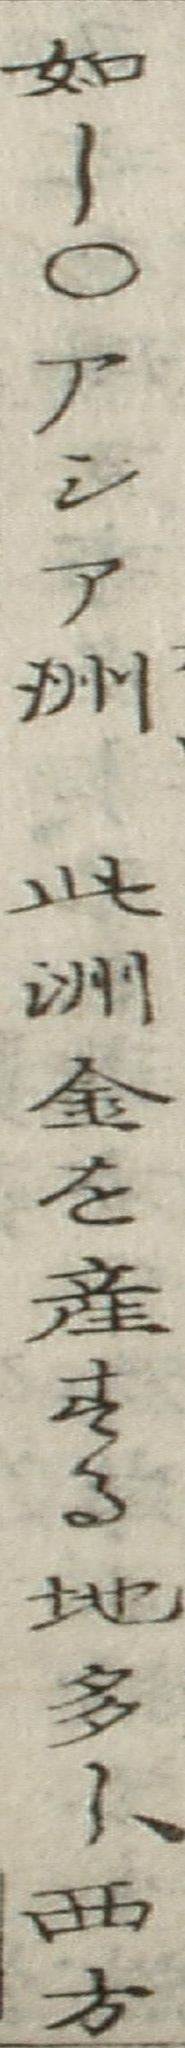如し○アシア洲、此洲金を産する地多し、西方
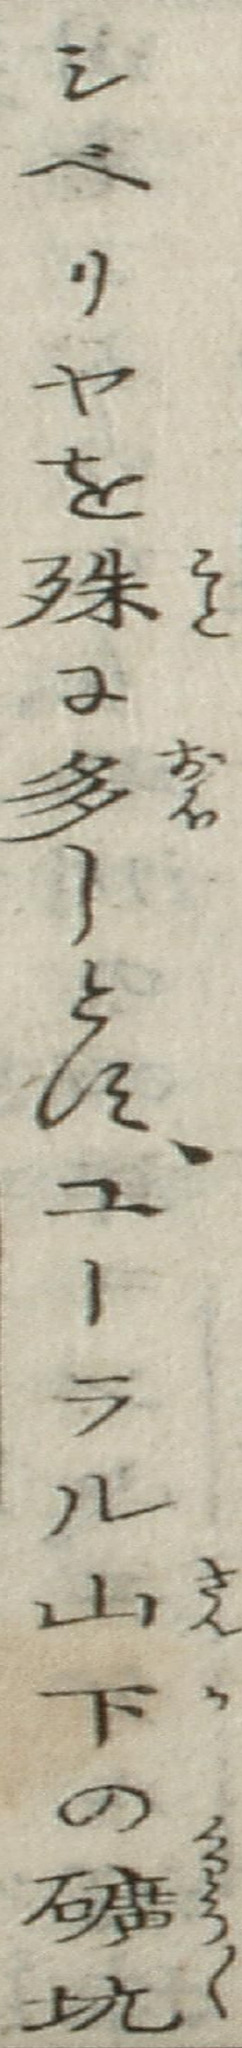シベリヤを殊に多しとす、ユーラル山下の砿坑
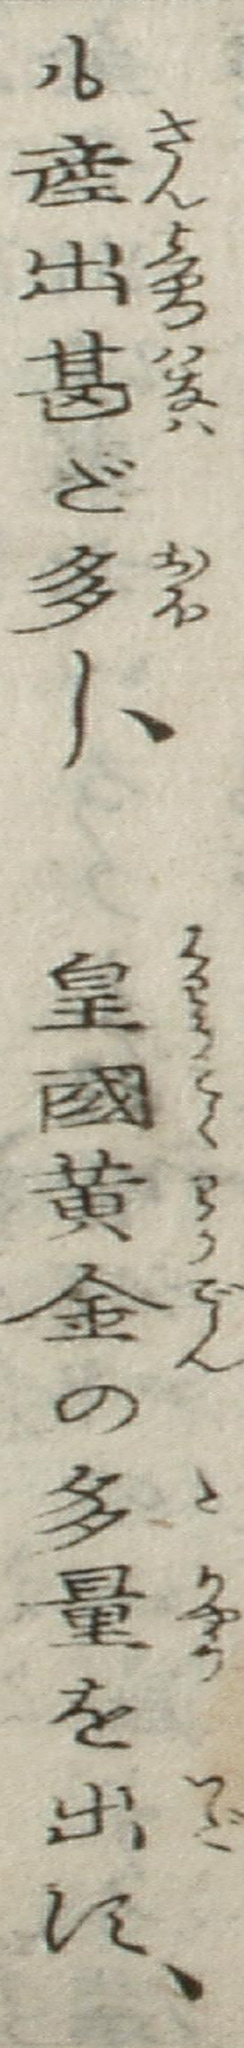も産出甚だ多し、皇国黄金の多量を出す、
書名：訓蒙　天然地理學　下
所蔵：東京大学地震研究所図書室 Earthquake Research Institute Library, The University of Tokyo, JAPAN
